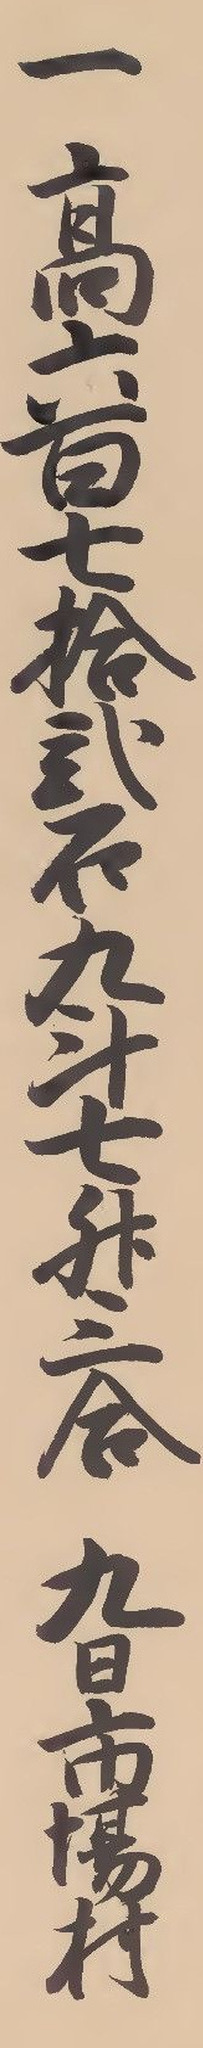一高六百七拾弐石九斗七升三合九日市場村
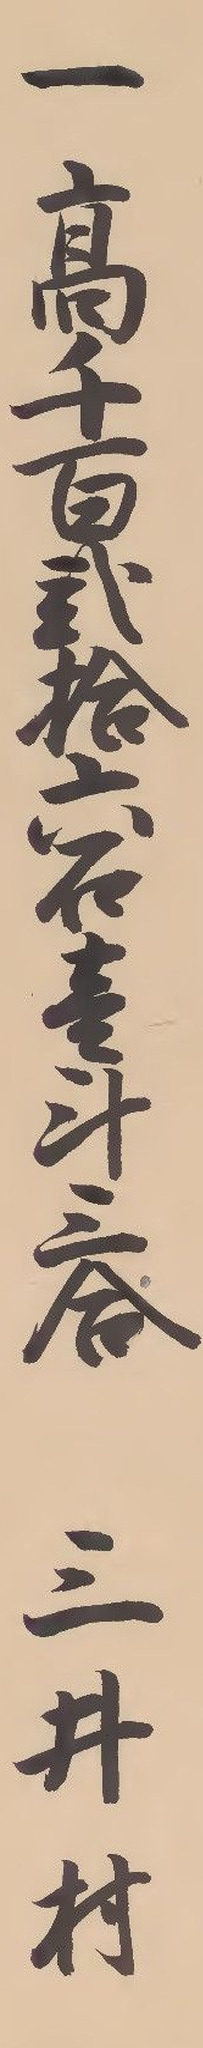一高千百弐拾六石壱斗三合三井村

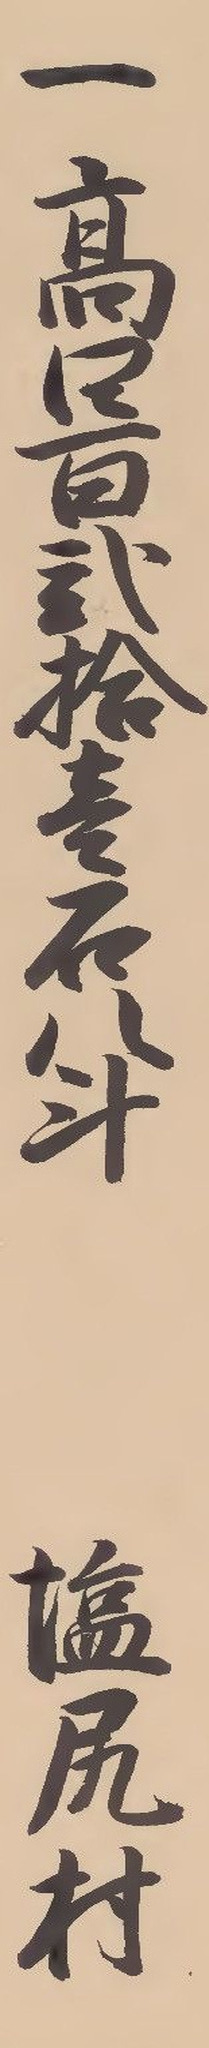一高四百弐拾壱石八斗塩尻村
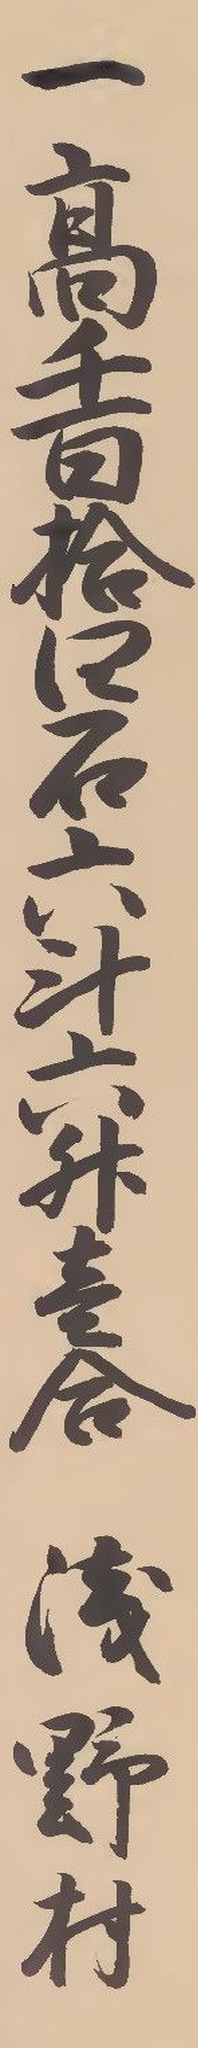一高千百拾四石六斗六升壱合浅野村
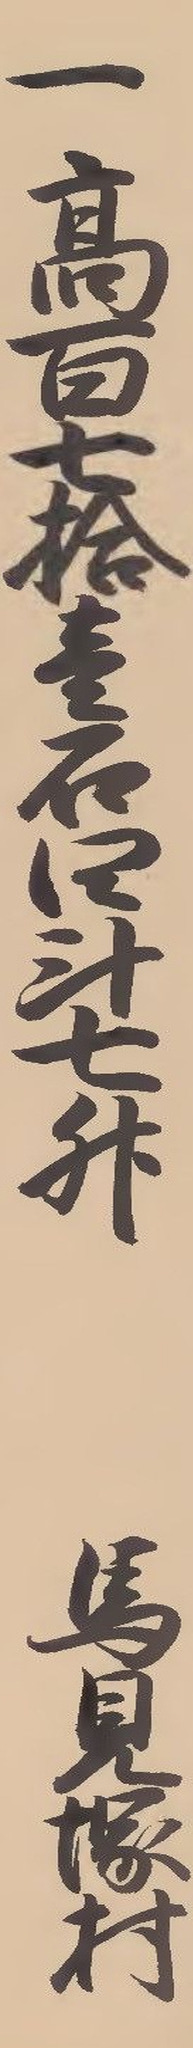一高百七拾壱石四斗七升馬見塚村
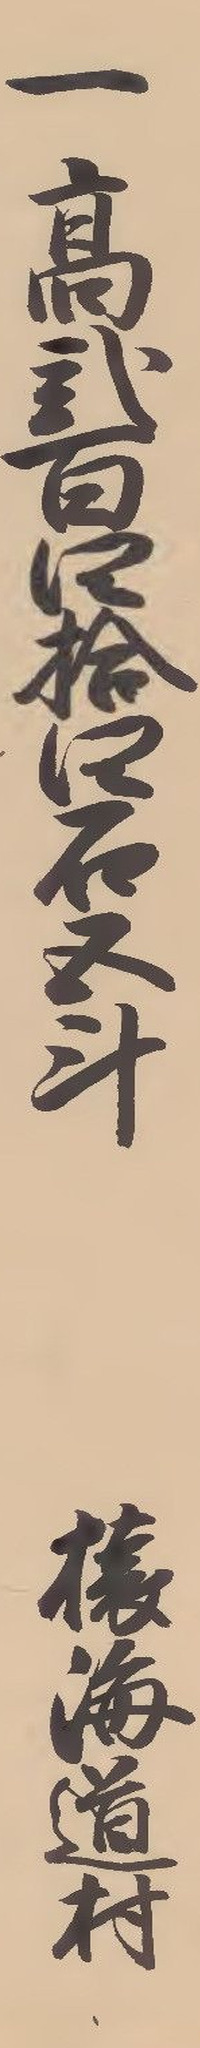一高弐百四拾四石五斗猿海道村
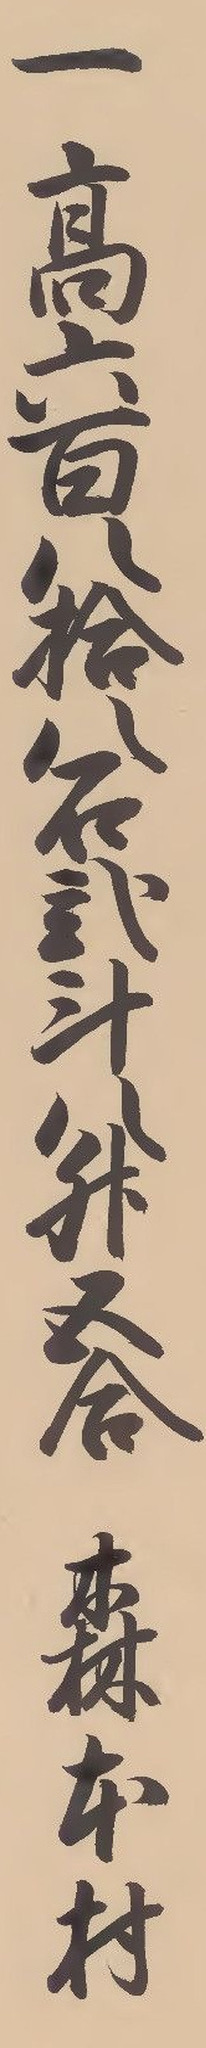一高六百八拾八石弐斗八升五合森本村

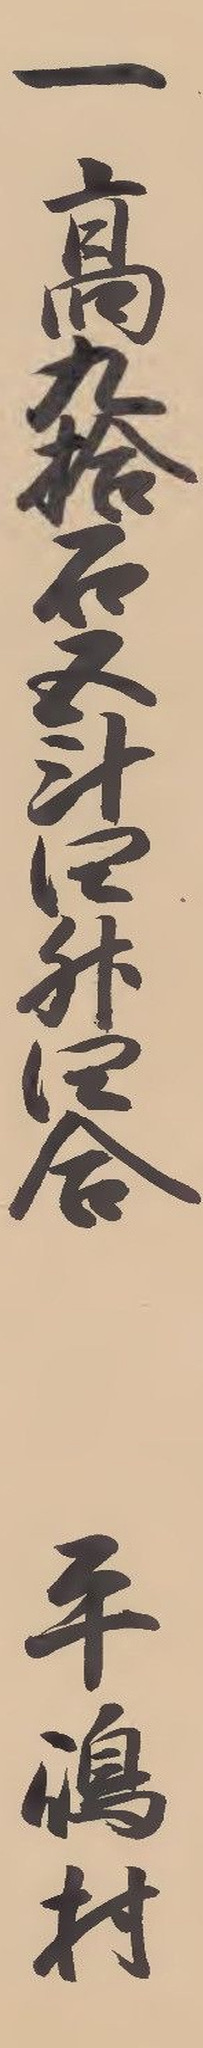一高九拾石五斗四升四合平島村
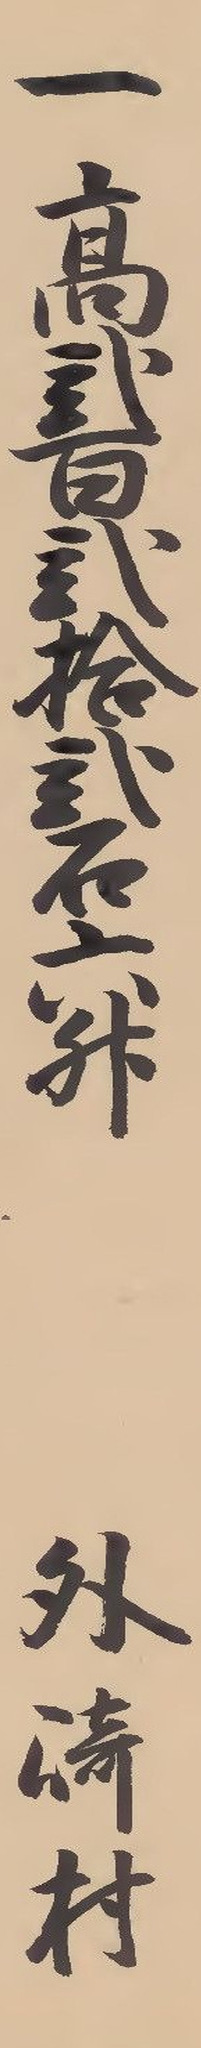一高弐百弐拾弐石六升外崎村
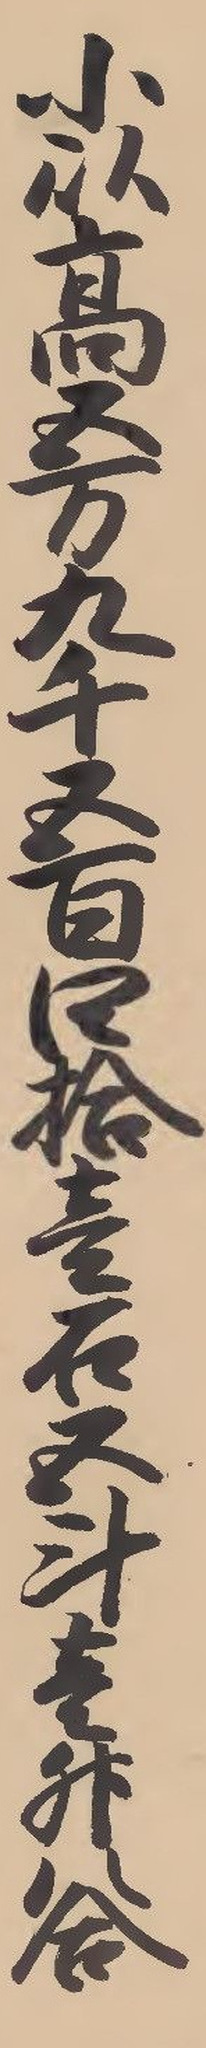小以高五万九千五百四拾壱石五斗壱升八合
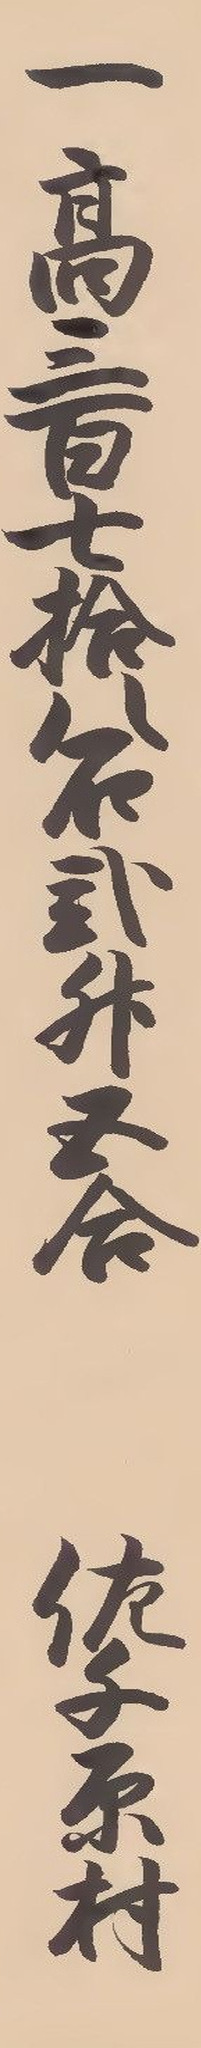一高三百七拾八石弐升五合佐千原村
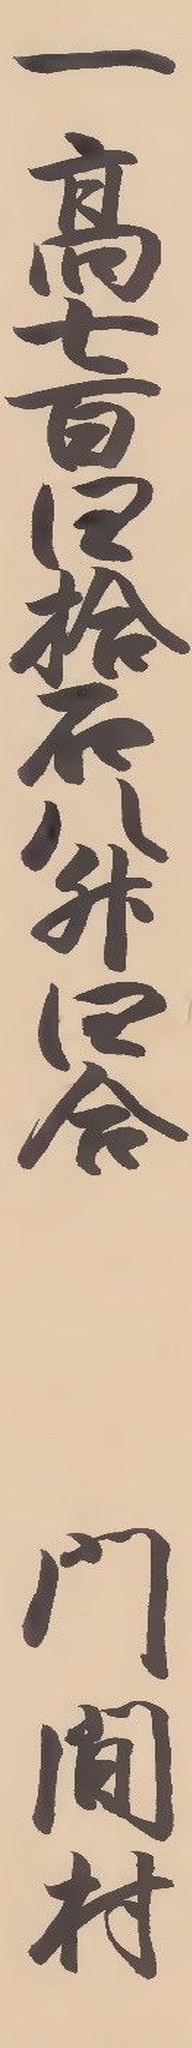一高七百四拾石八升四合門間村
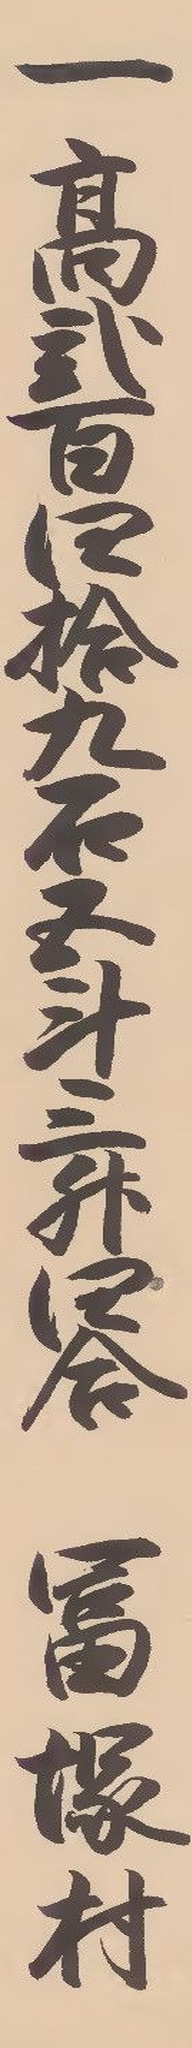一高弐百四拾九石五斗三升四合富塚村

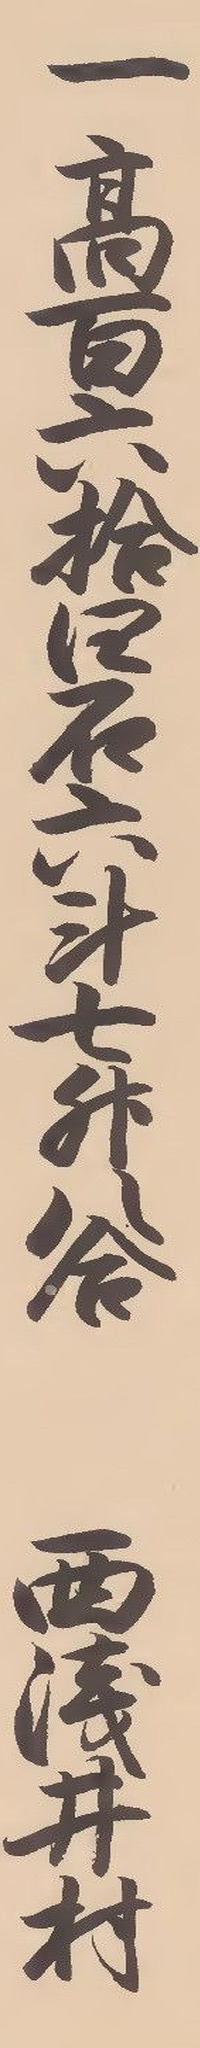一高百六拾四石六斗七升八合西浅井村
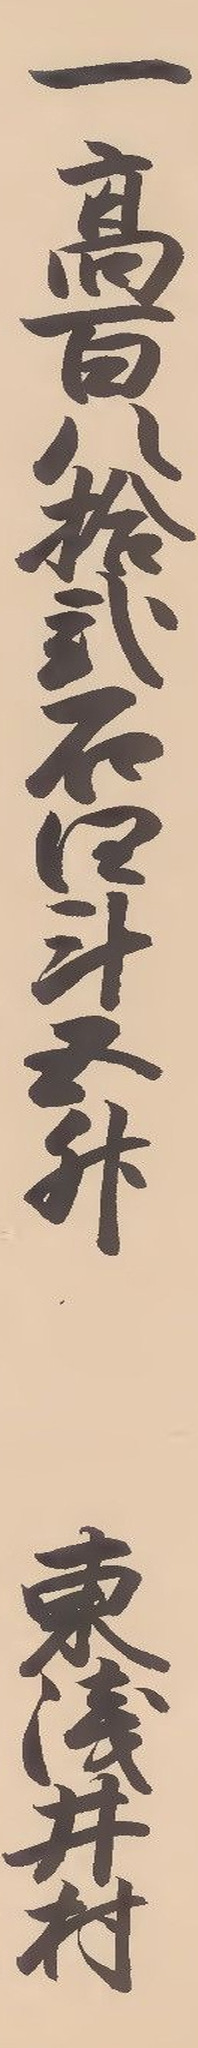一高百八拾弐石四斗五升東浅井村
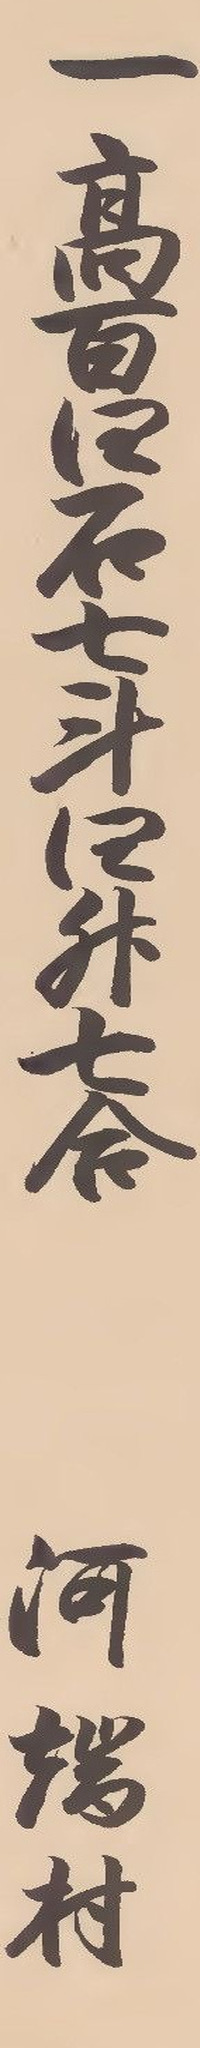一高百四石七斗四升七合河端村
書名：尾張国郷帳
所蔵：国立公文書館 National Archives of Japan
